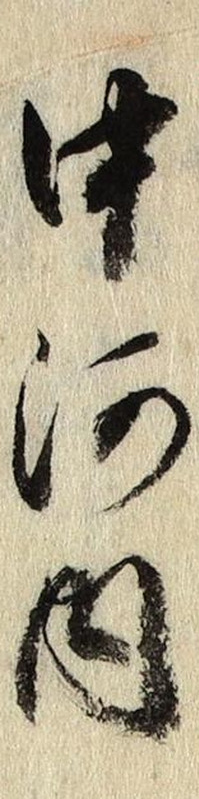中河内
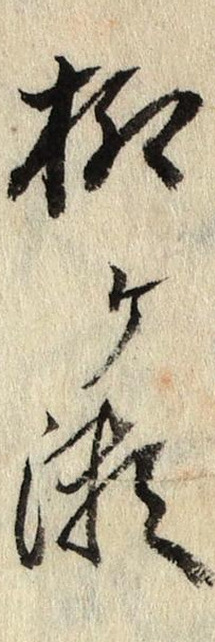柳ヶ瀬

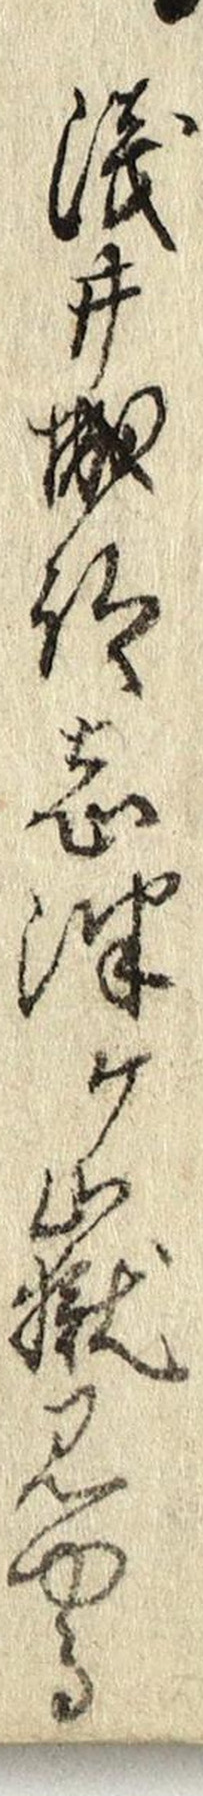浅井城跡志津ケ嶽見ゆる
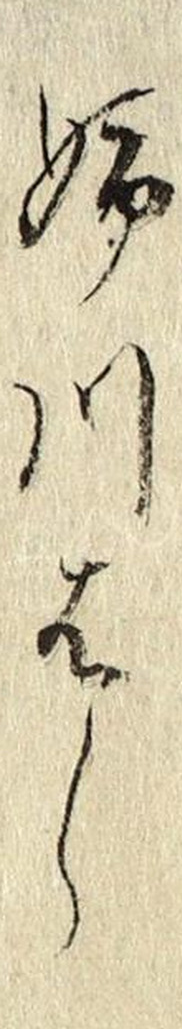姉川はし
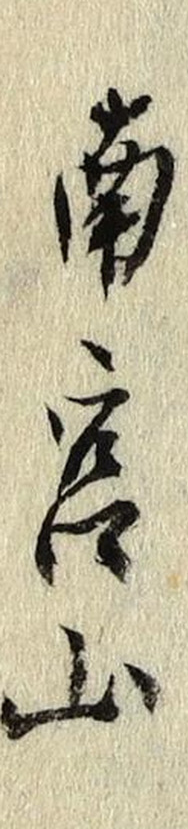南宮山
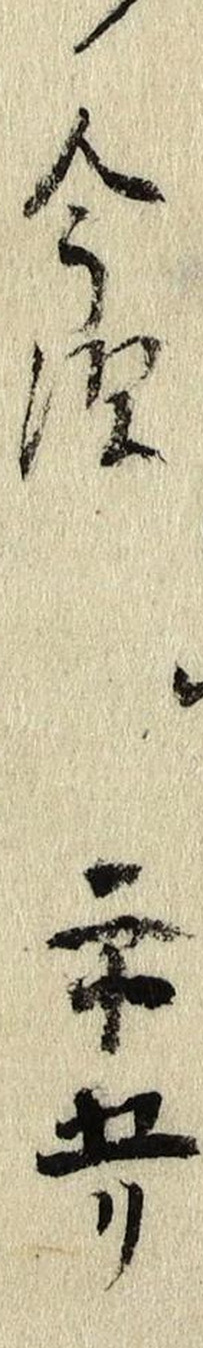今須二十五リ
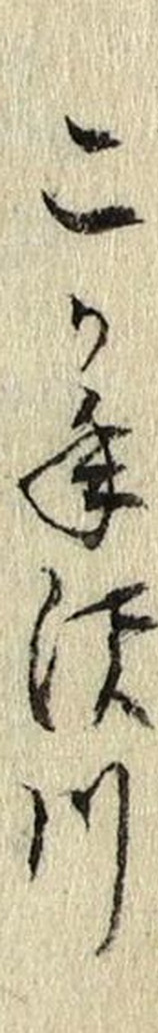こかね沢川
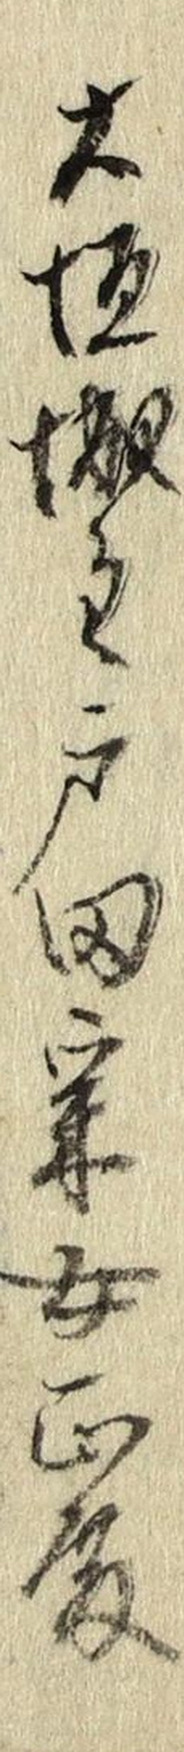大垣城主戸田采女正殿
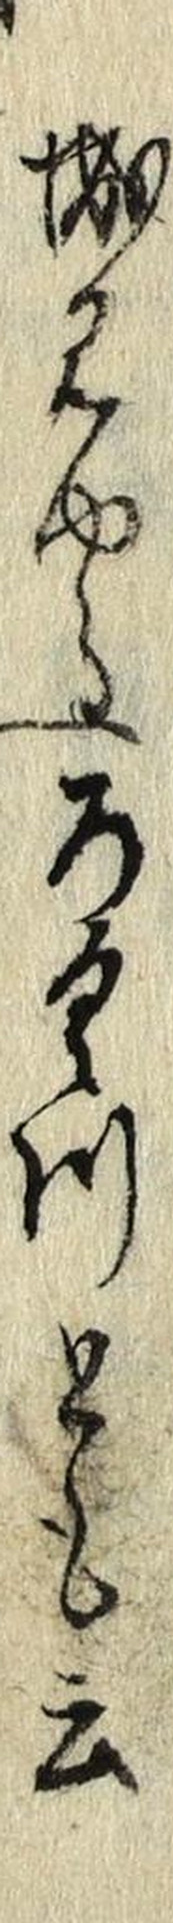城見ゆるろく川とも云
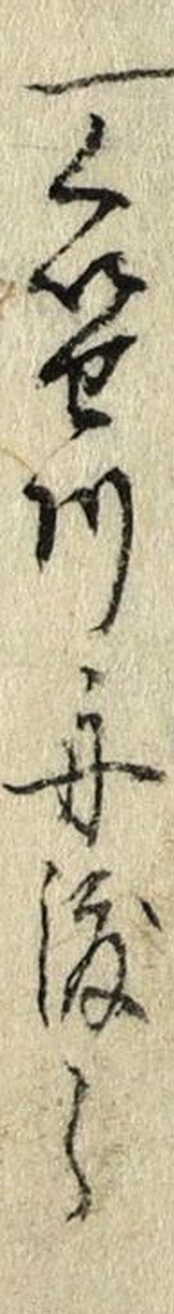くいせ川舟渡し
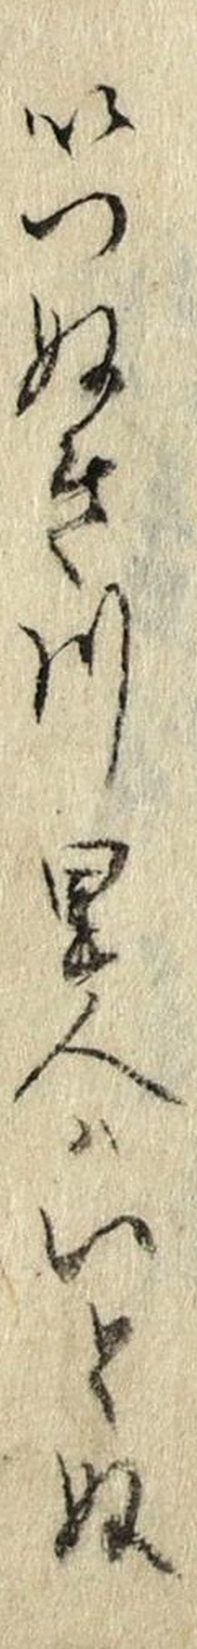いつぬき川里人はいとぬ
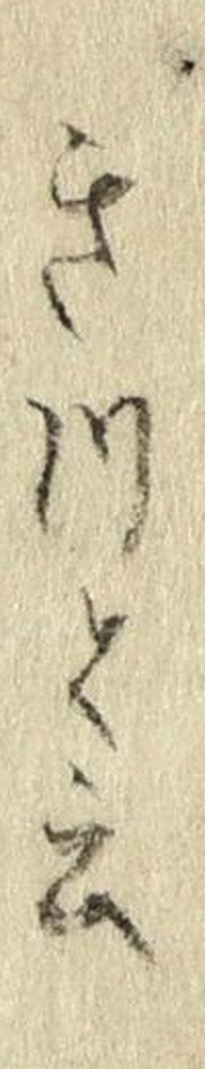き川と云

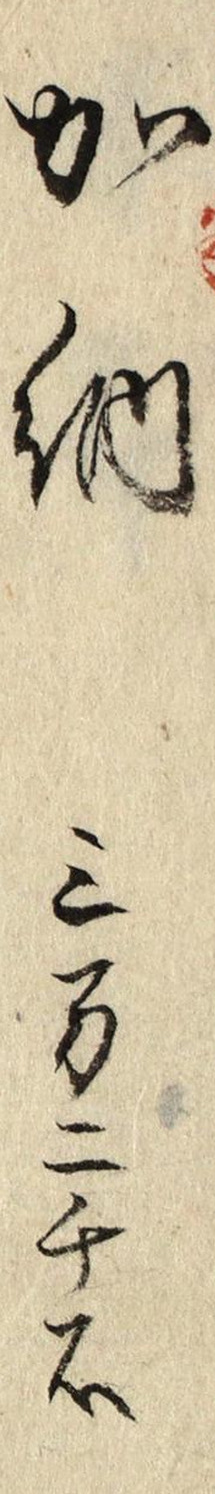加納三万二千石
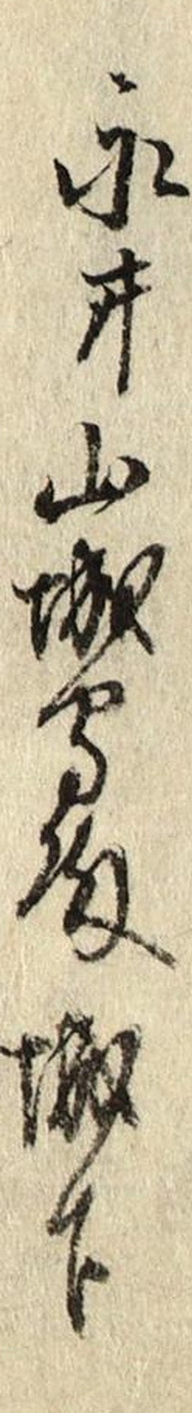永井山城守殿城下
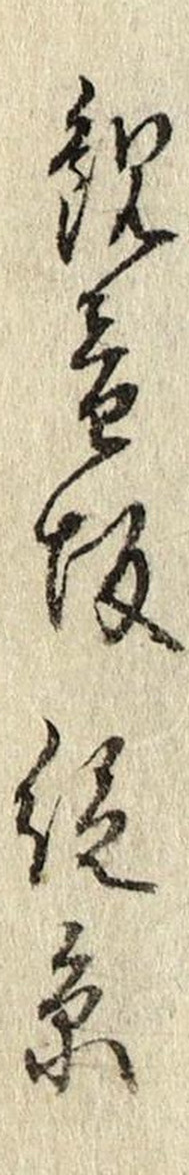観音坂絶景
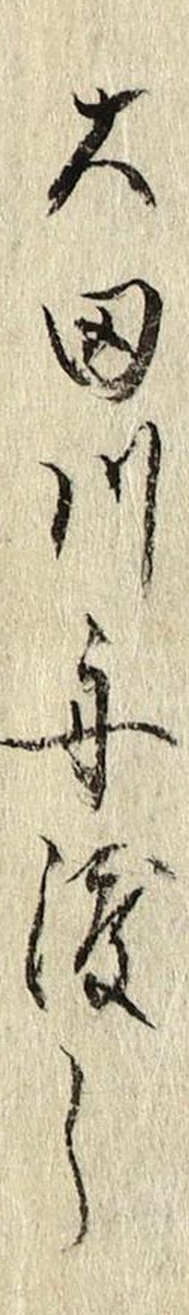大田川舟渡し
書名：中仙道道中覚
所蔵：福井県文書館 Fukui Prefectural Archives
